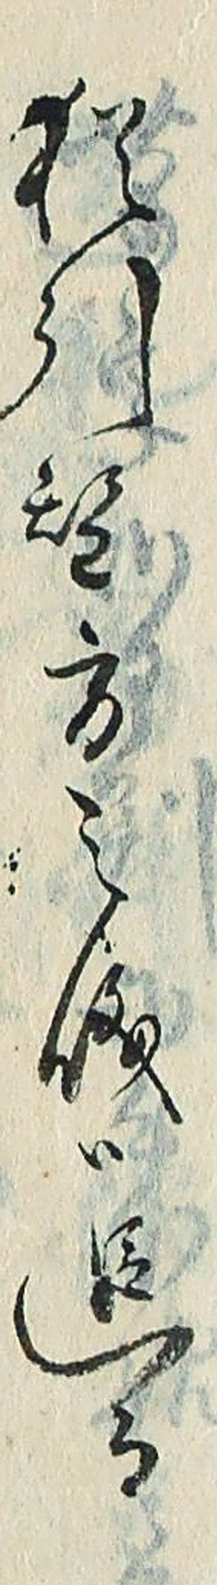猶引替方之儀は追而
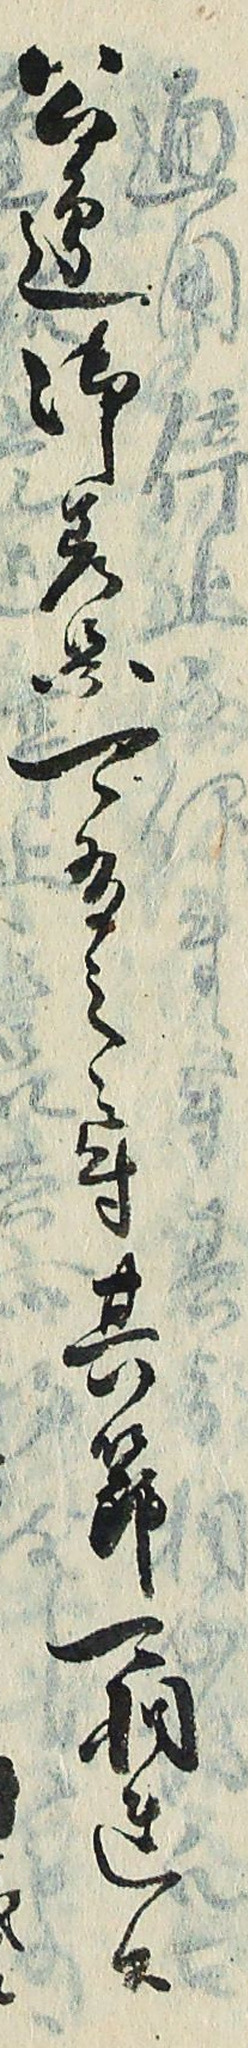公辺御差図可有之候に付其節可相達候
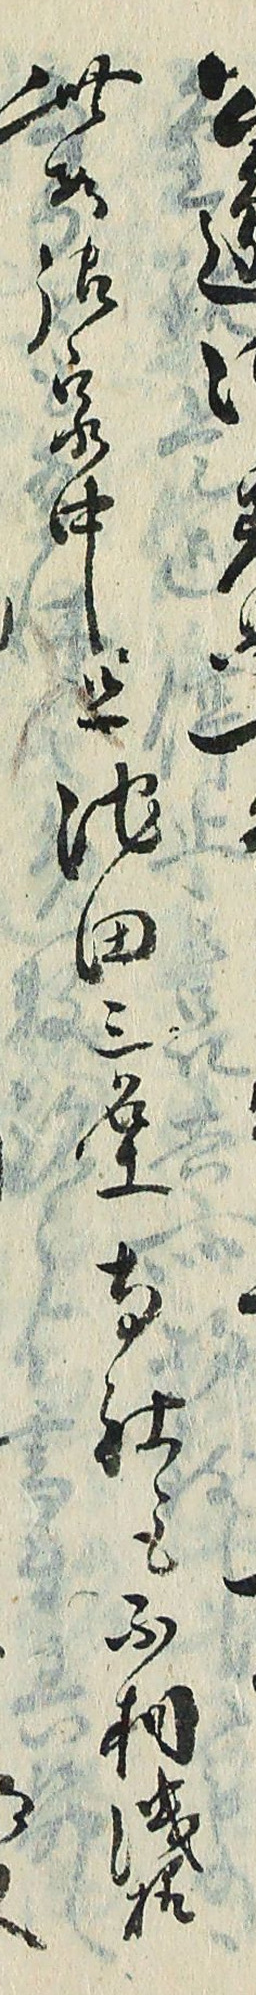此段御家中に且池田三座寺社へも不相洩様
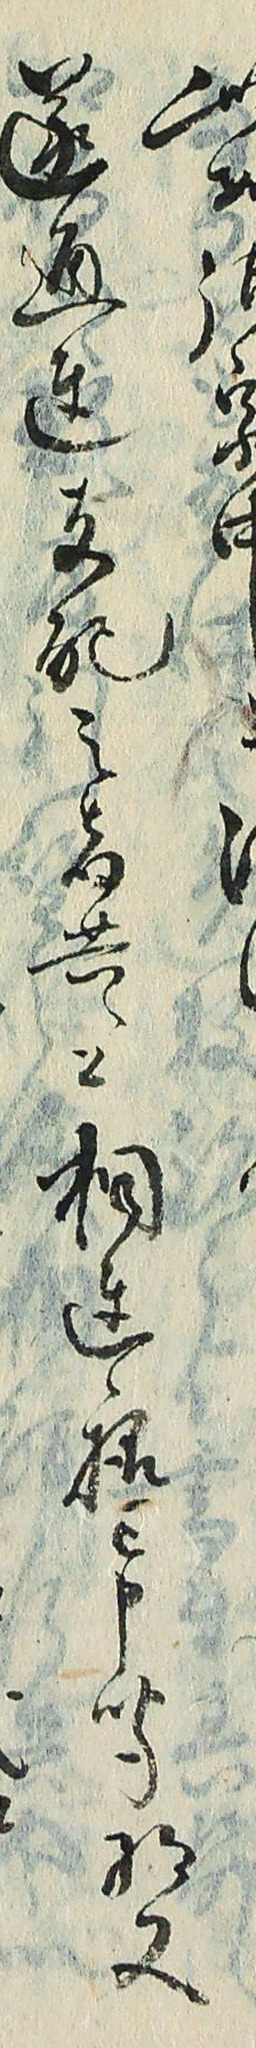遂通達支配之者共へも相達候様被申聞将又
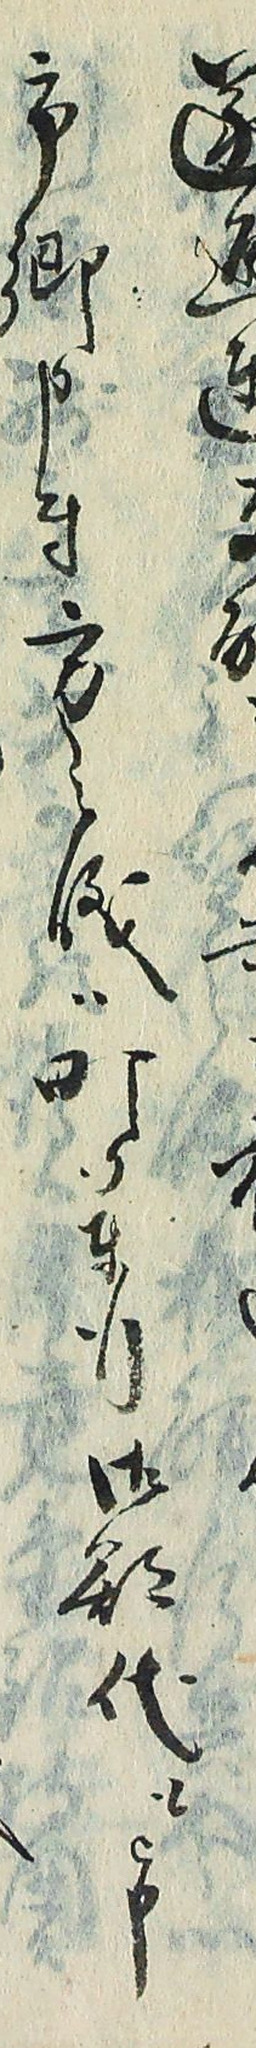市郷申付方之儀は町御奉行御郡代も被申
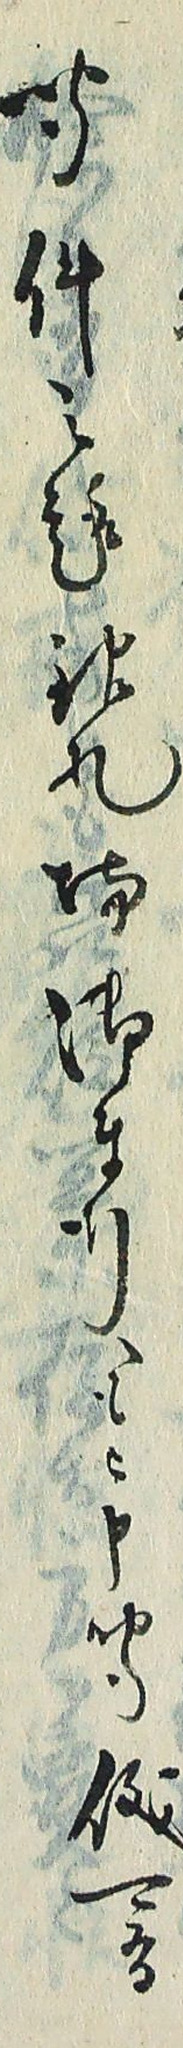聞件之趣銀札場御奉行へも被申聞儀可有
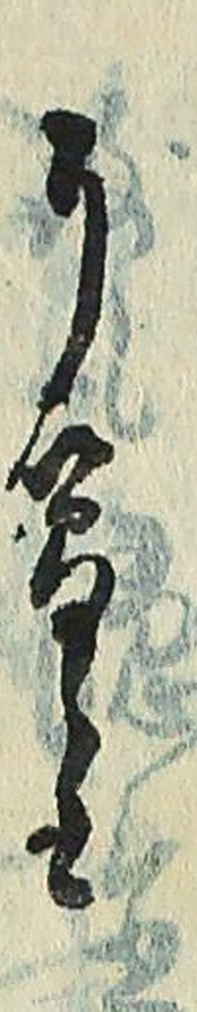了簡候以上
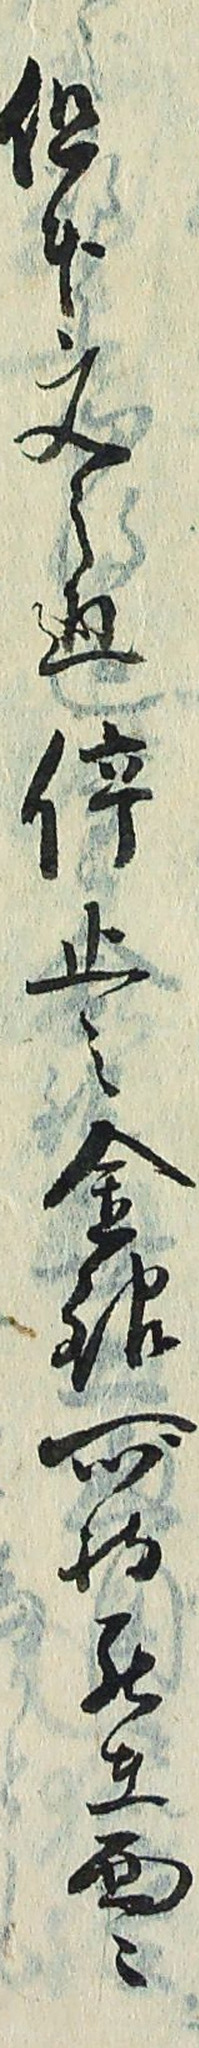但本文之通停止之金銀所持罷在面々
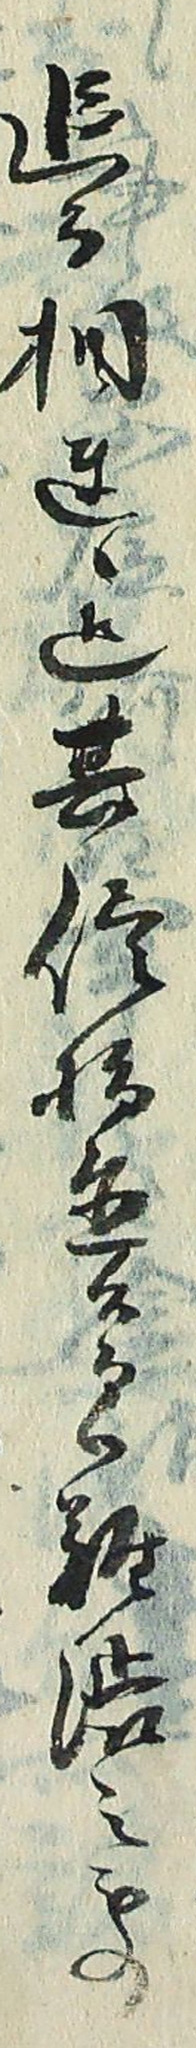追而相達候迄其侭指置候而は難渋之もの
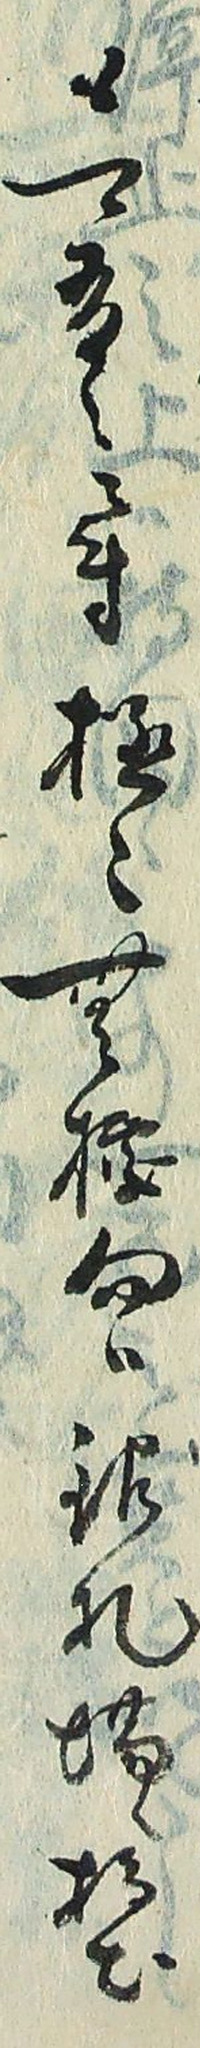も可有之に付極々無據向は銀札場へ指出
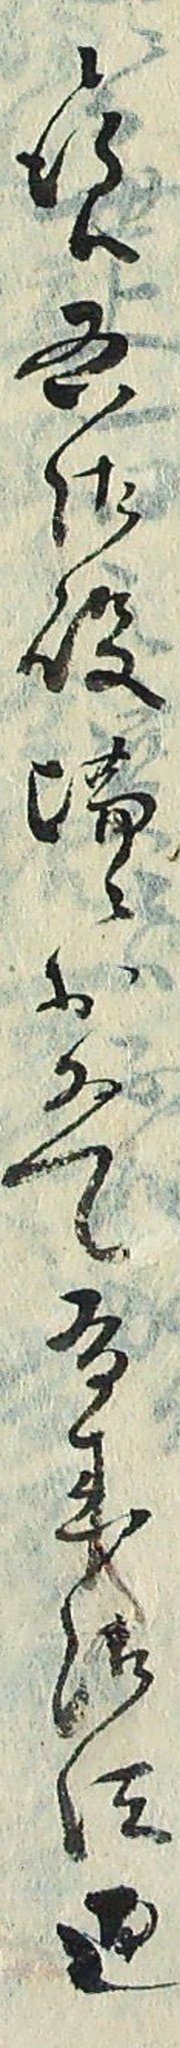候得は右御役場におゐて有来御法通
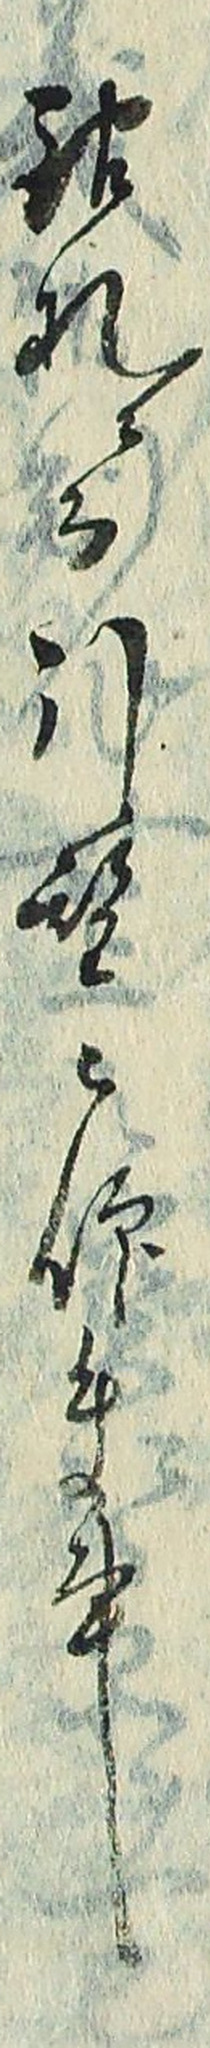銀札に而引替被仰付事
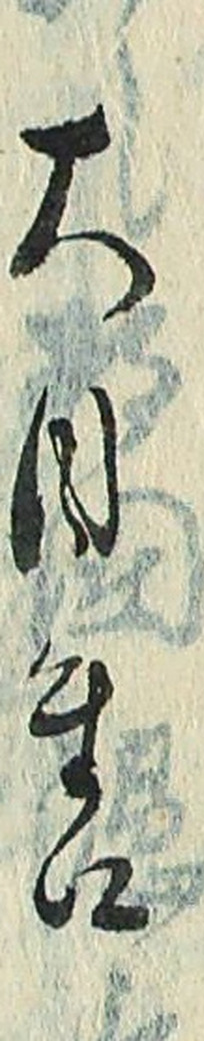大目付江
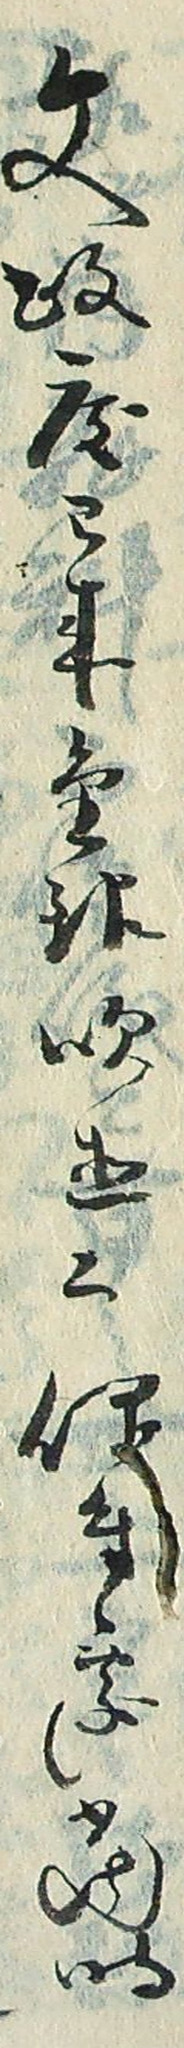文政度已来金銀吹直被仰付候処当時
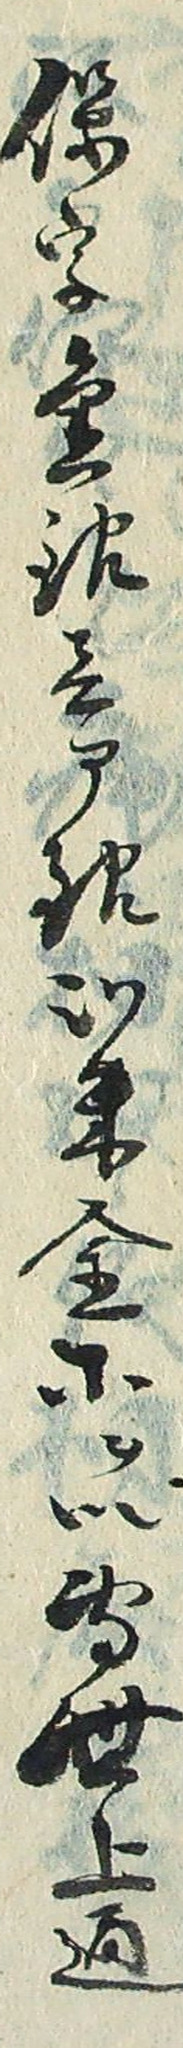保字金銀壱分銀二朱金等を以専世上通

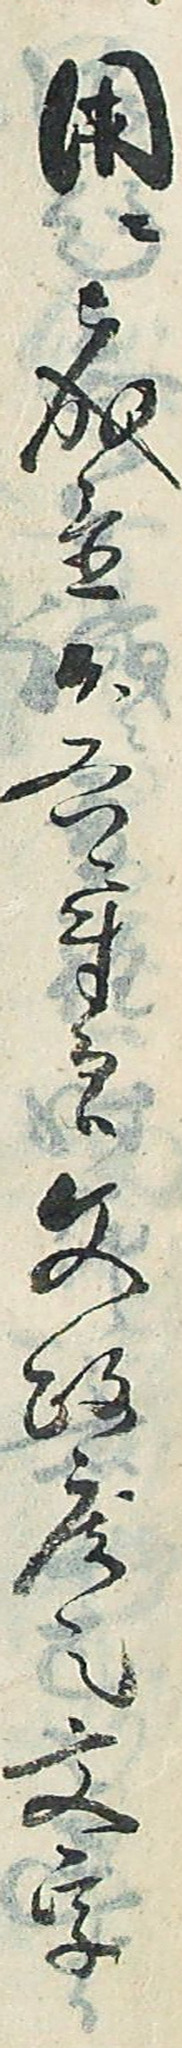用に被成置候右に付而は文政度之文字
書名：諸御用御□受書控
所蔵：鳴門教育大学 Naruto University of Education
